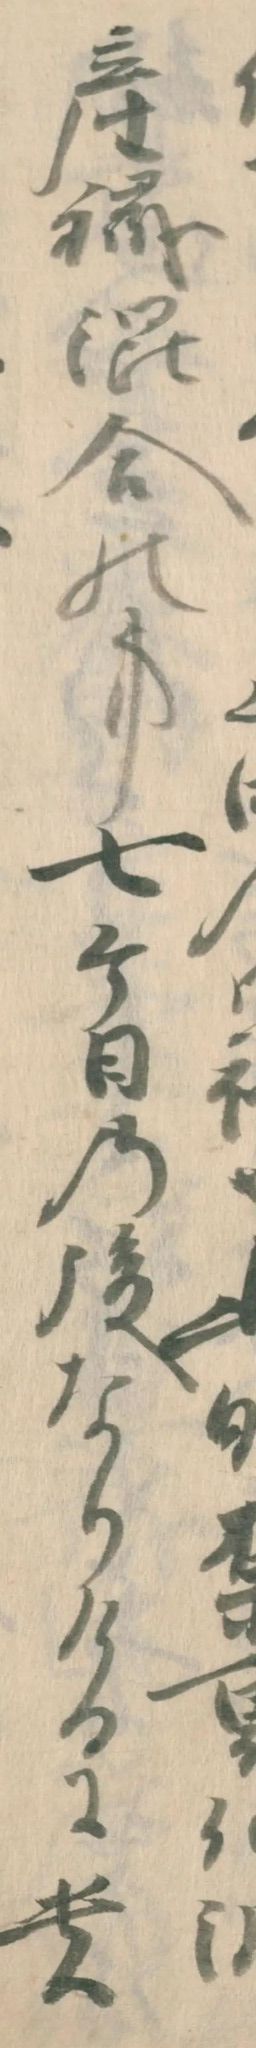産穢混合の事七ヶ日の後なりけるに貴
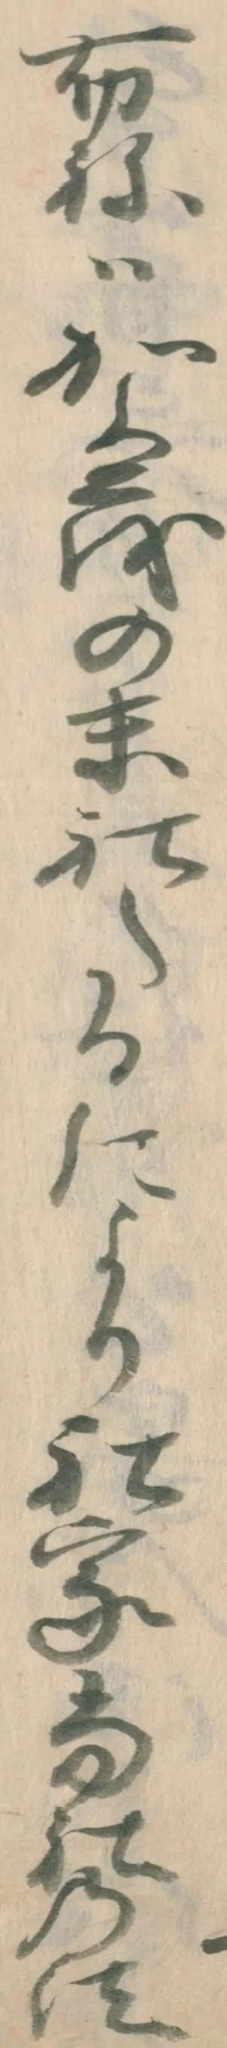ふねは賀茂の末社たるにより社家当社の法

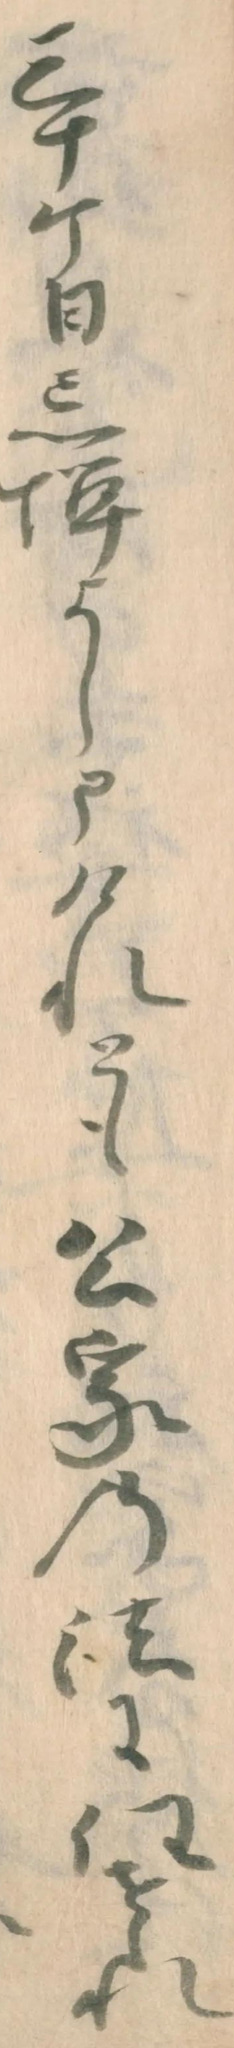三十ヶ日忌憚よし申けれとも公家の法に任せられ
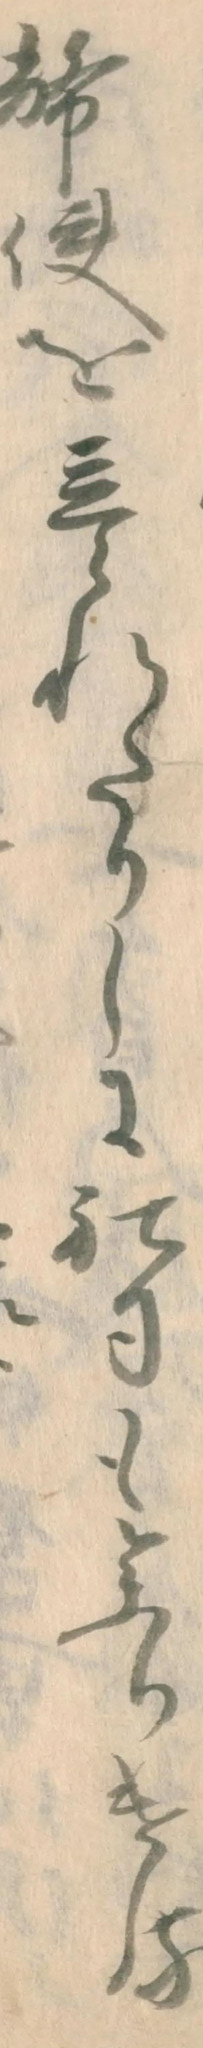幣使を立られたりしに社司も参りける
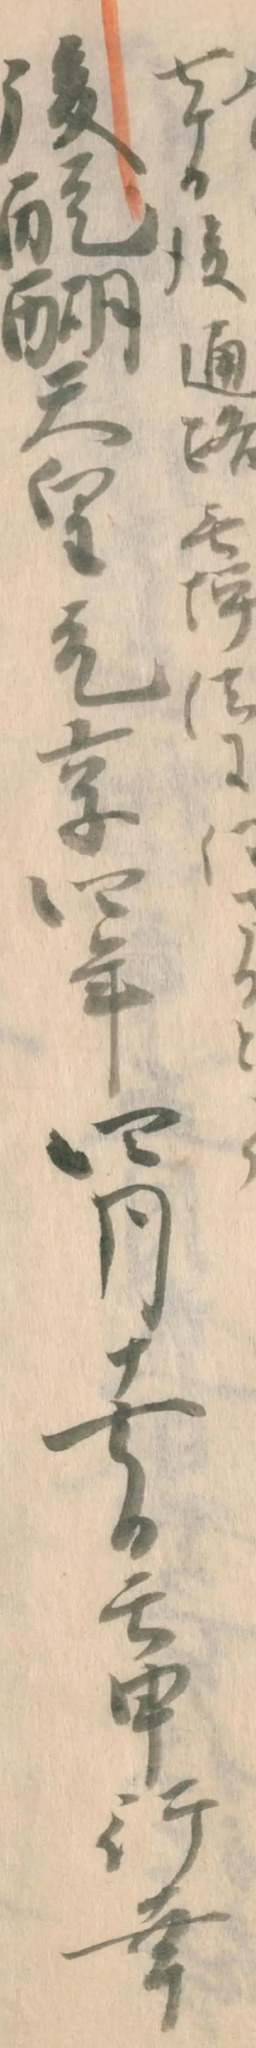後醍醐天皇元享四年四月十七日壬申行幸
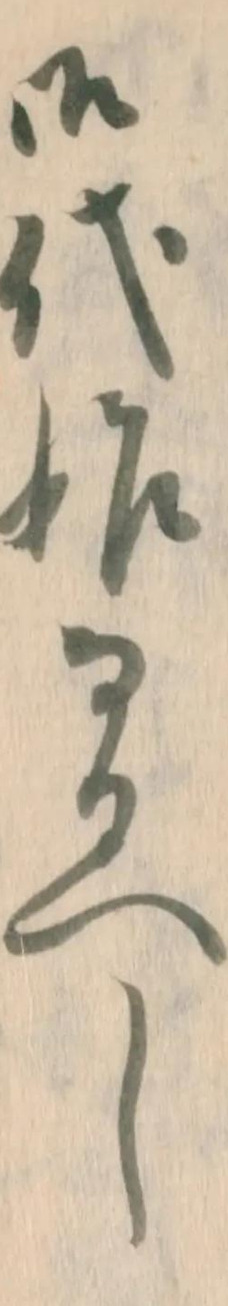御代始なるへし
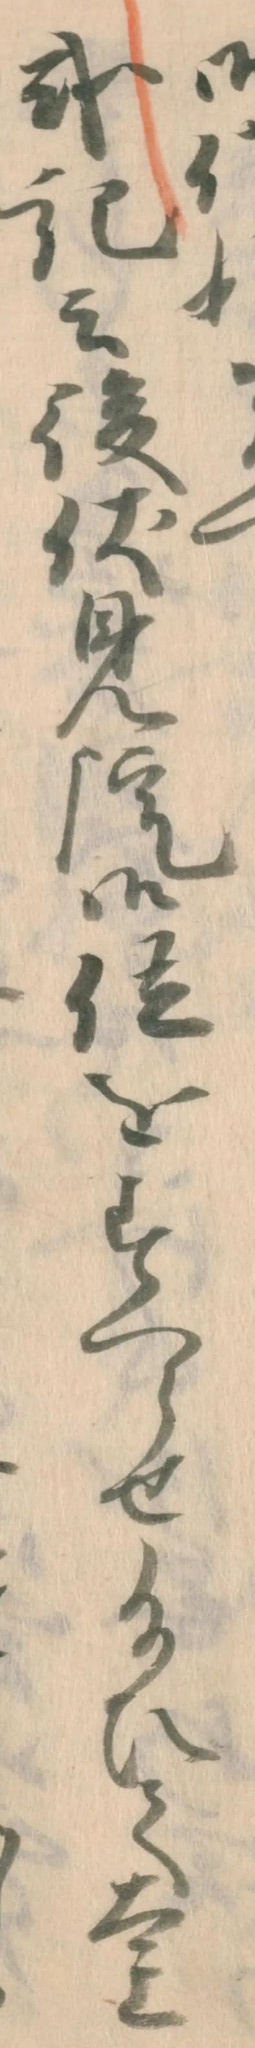或記云後伏見院御位をすへらせ給ひて太上
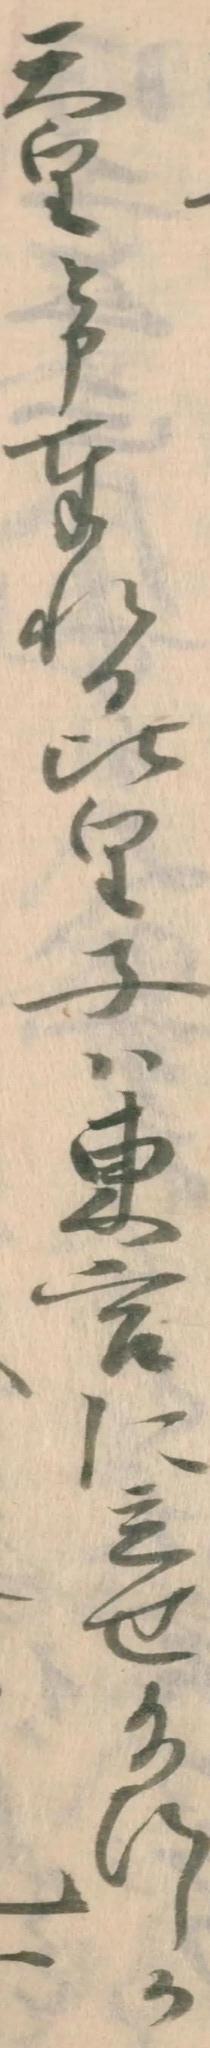天皇と申奉れる比皇子は東宮に立せ給ひしか
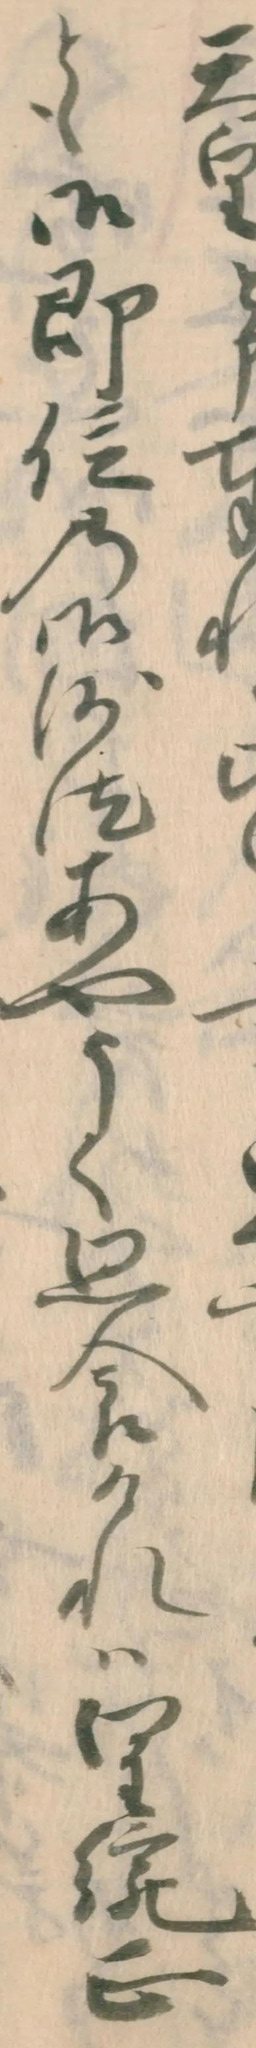とも御即位の御沙汰あやうく思食けれは皇統正
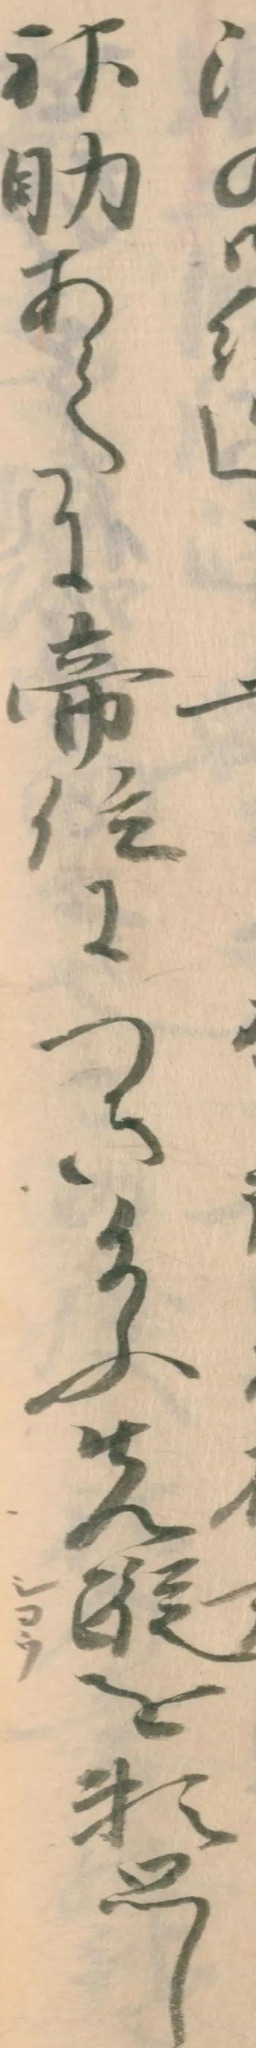神助あらたに帝位につき給ふ先縦を頼思し
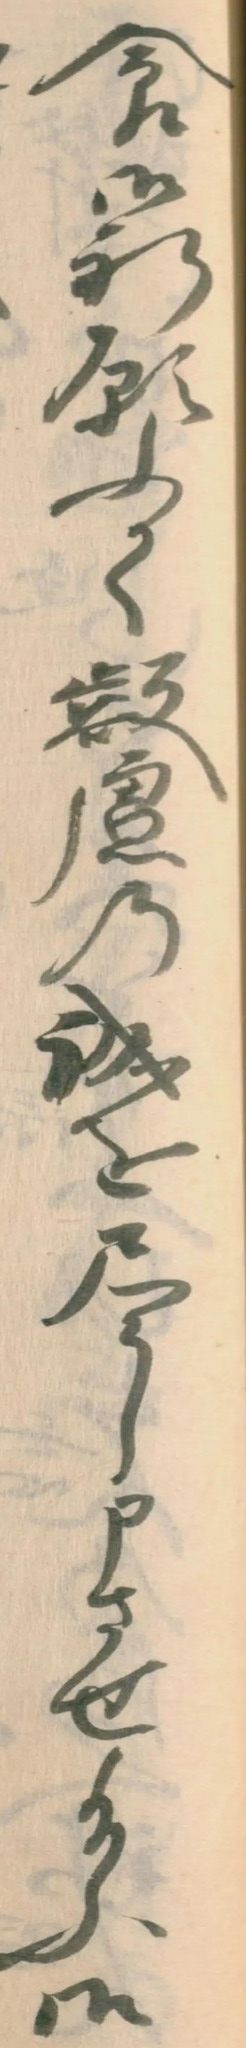食御祈願ふかく叡慮の誠を尽し申させ給ふ御
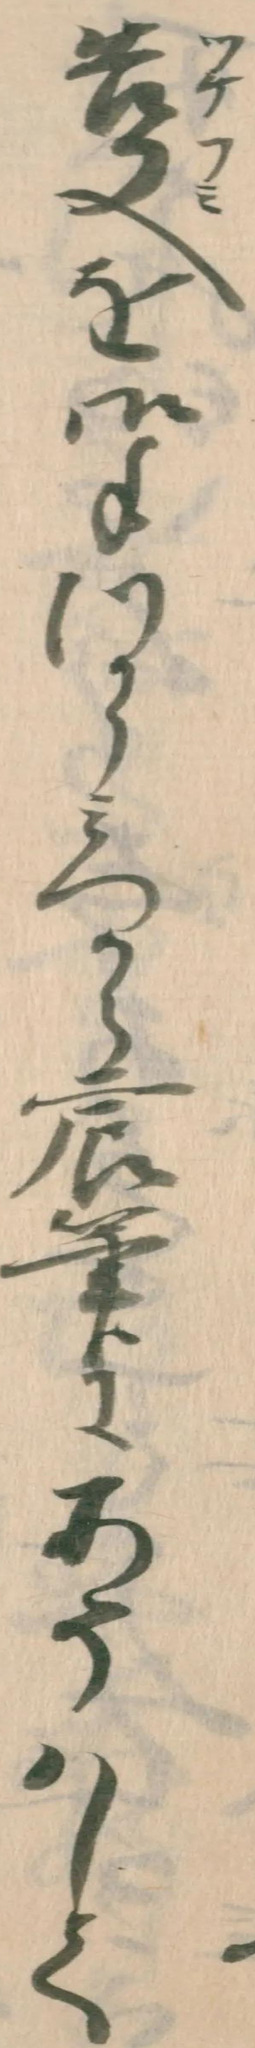告文を御手つからみつから宸筆にあそはして
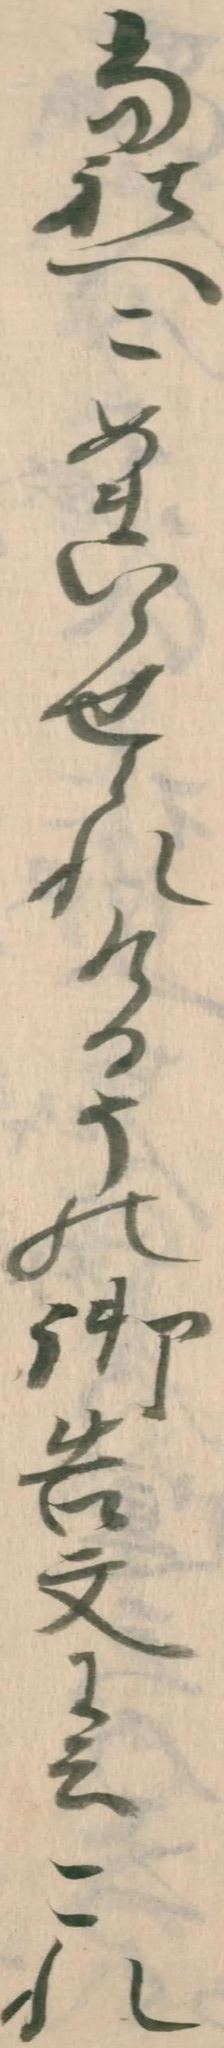当社へこめまいらせられけるその御告文に云これ
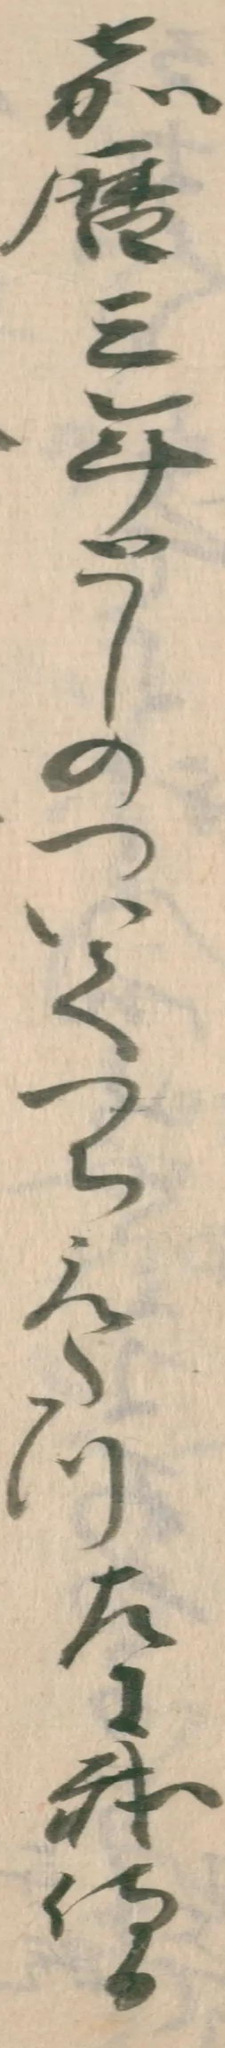嘉暦三年としのついてつちえたつ左に我侍る
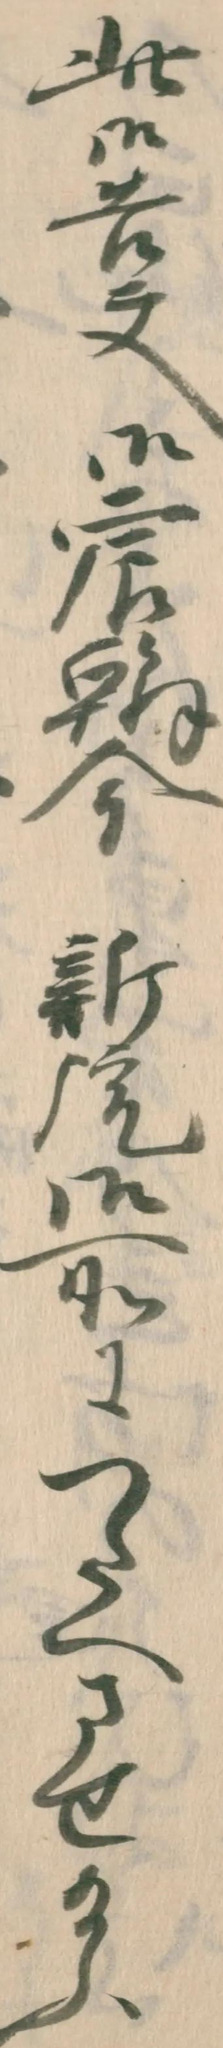此御告文御宸翰今新院御所につたへさせ給ふ
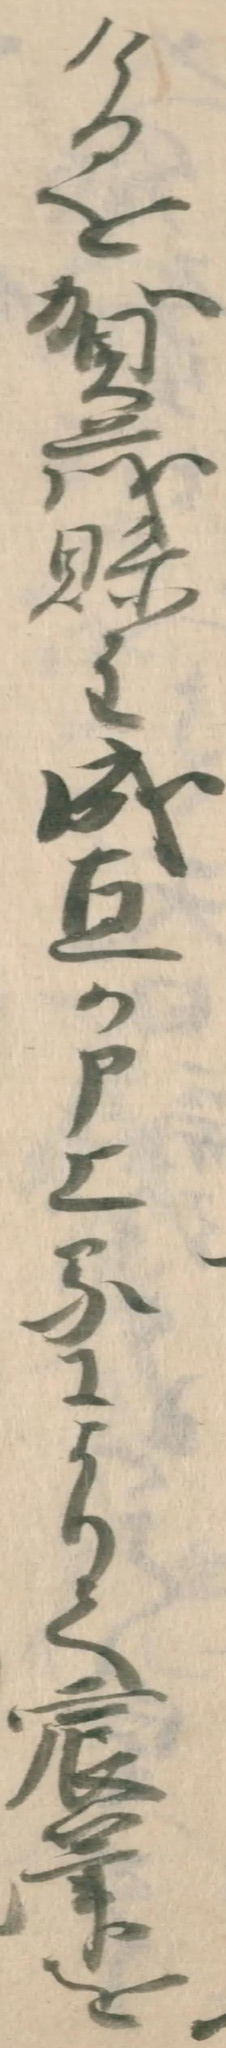けるを賀茂縣主成直か申上るによりて宸筆を
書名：賀茂社記録. 第1冊
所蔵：国立国会図書館 National Diet Library, JAPAN
